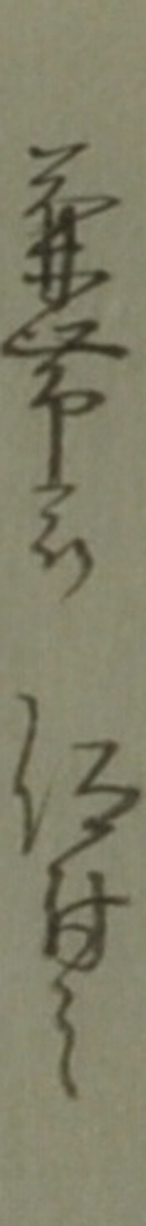兼帯被仰付之
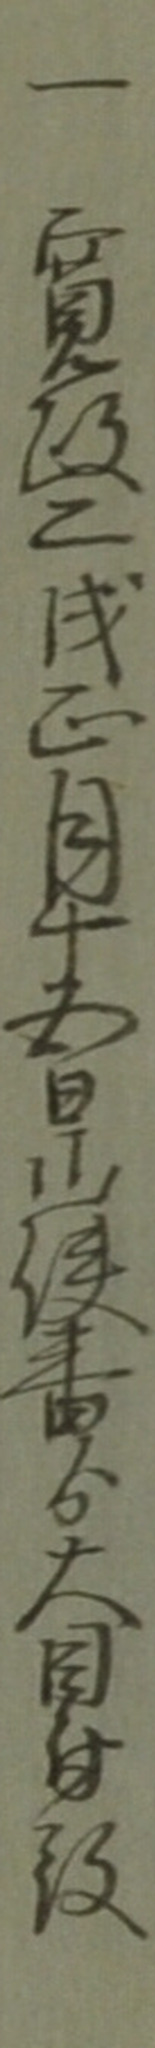一寛政二戌正月十五日御使番ゟ大目付役
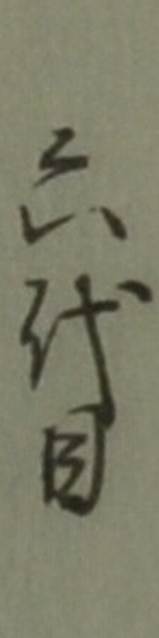六代目
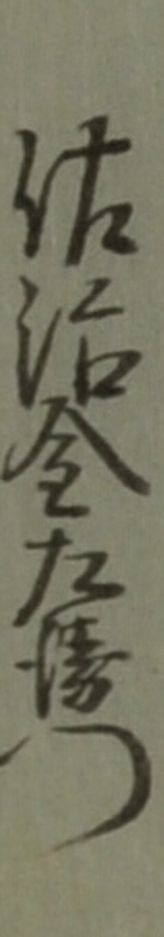佐治金左衛門
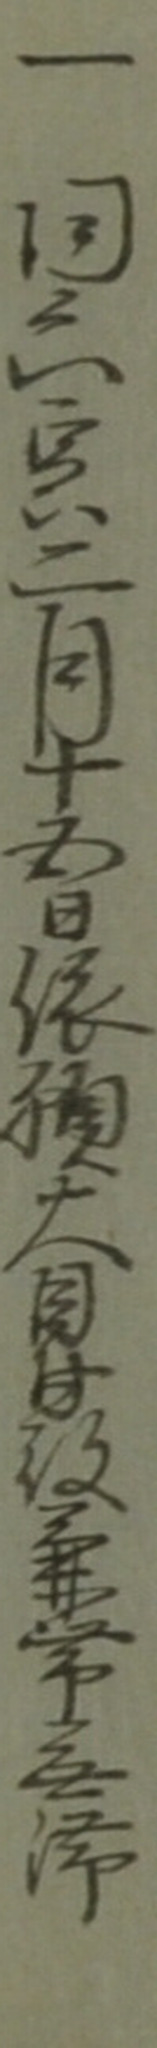一同六寅二月十五日以願大目付役兼帯無滞
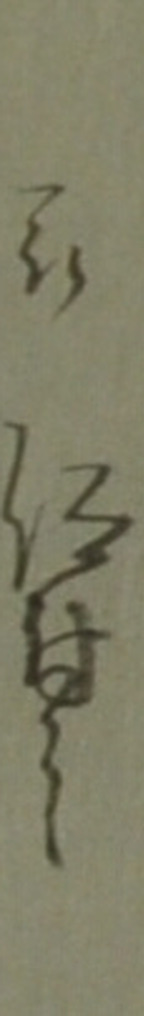被仰付之
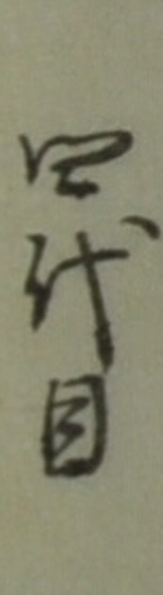四代目

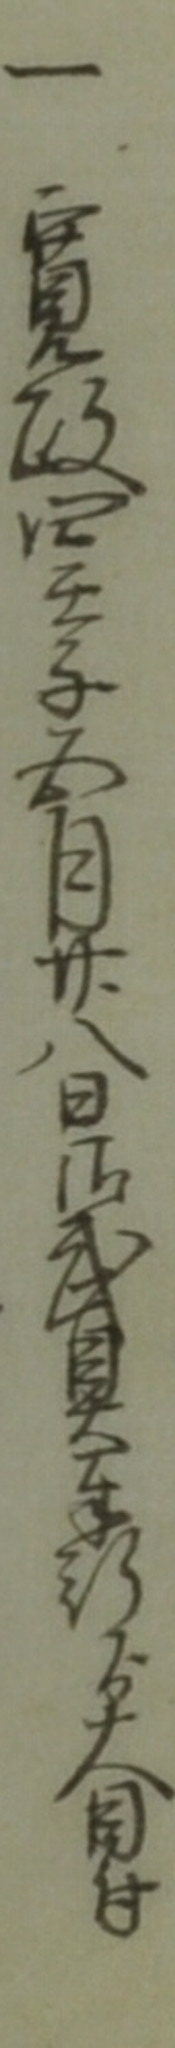一寛政四壬子五月廿八日御武具奉行ゟ大目付
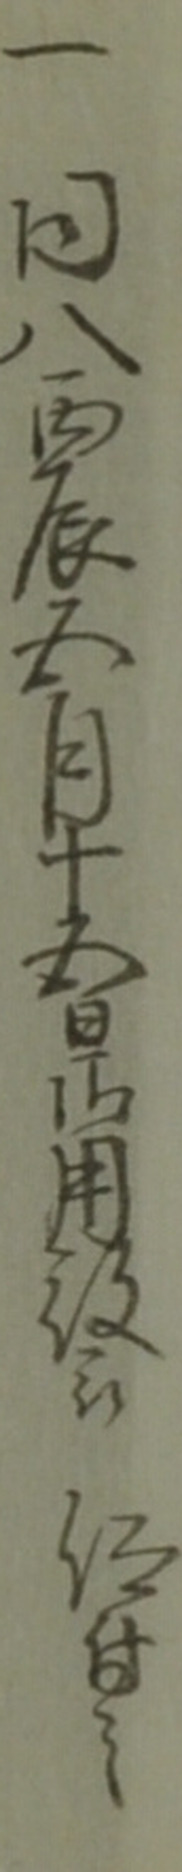一同八丙辰五月十五日御用役被仰付之
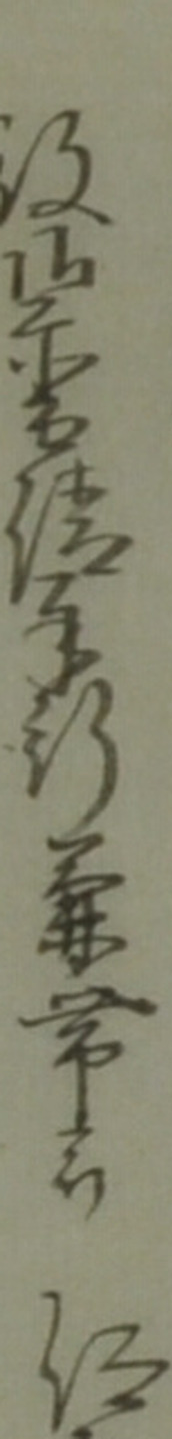役御普請奉行兼帯被仰付
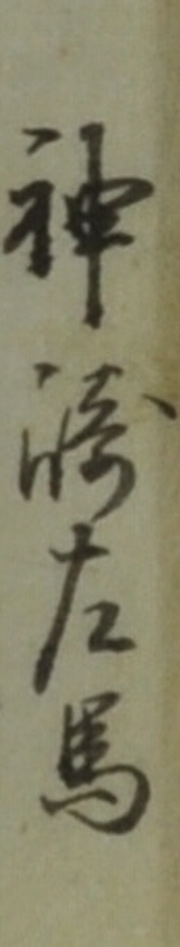神崎左馬
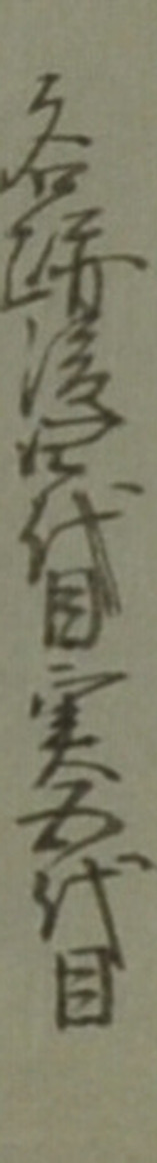名跡後四代目実五代目
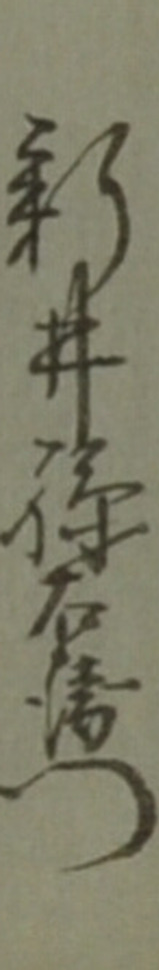新井孫右衛門
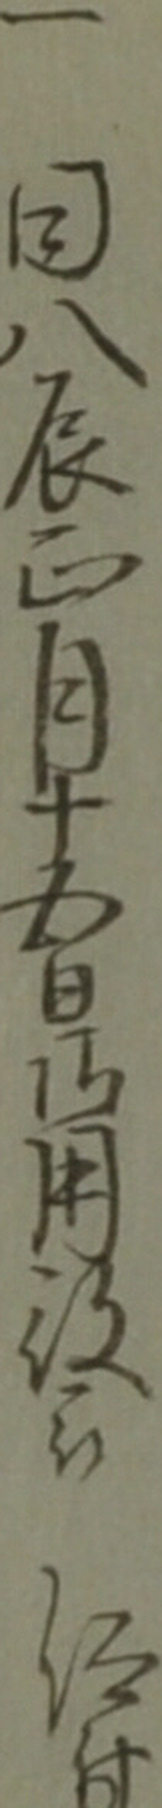一同八辰正月十五日御用役被仰付之
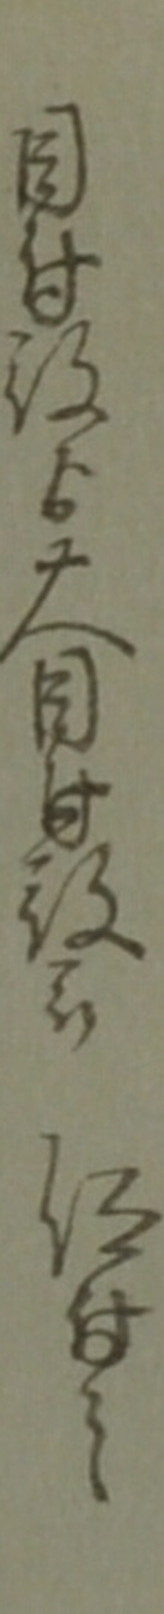目付役ゟ大目付役被仰付之
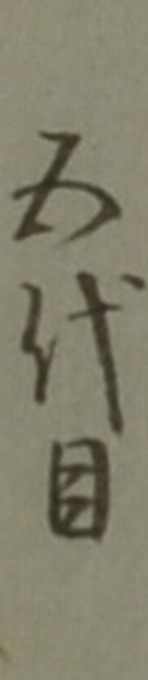五代目
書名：諸御役代々録（三）
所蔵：伊那市立高遠町図書館・合同会社AMANE
